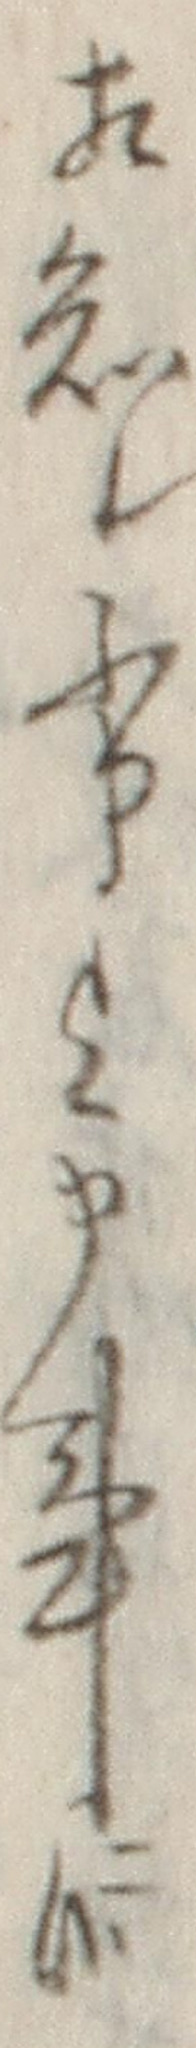相知レ不申と申事ニ候

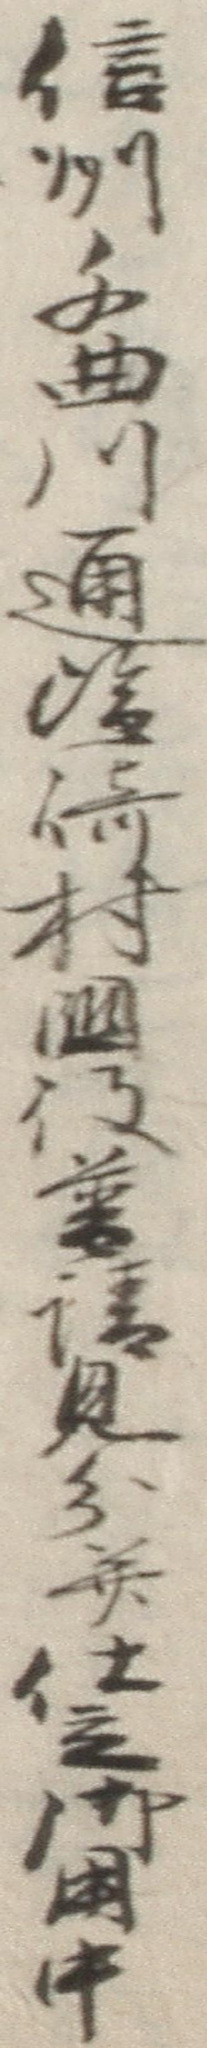信州千曲川通塩崎村国役普請見分并仕立御用中
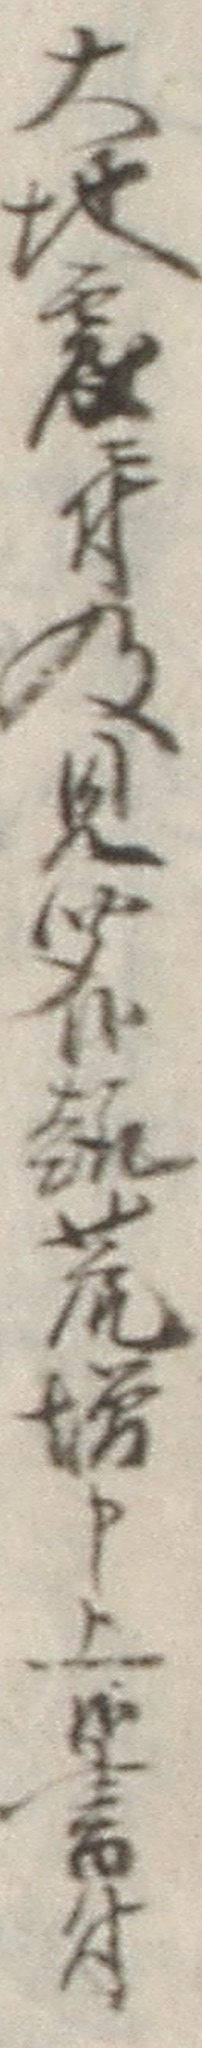大地震ニ付及見聞候趣荒増申上候書付
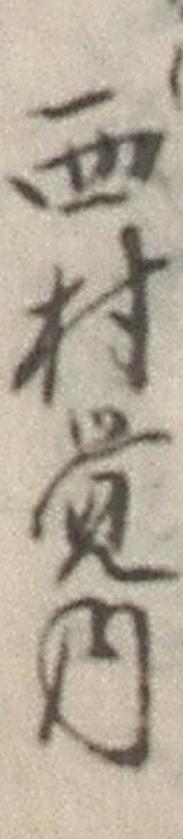西村覚内
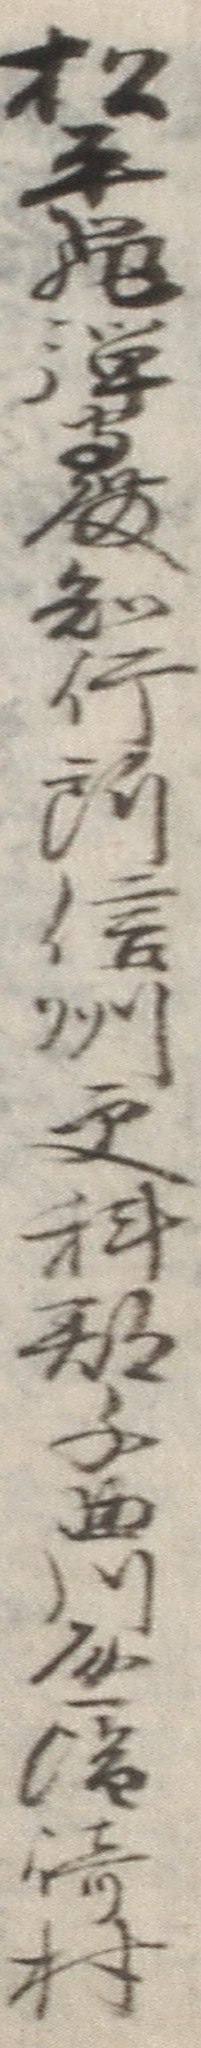松平飛騨守殿知行所信州更科郡千曲川通塩崎村
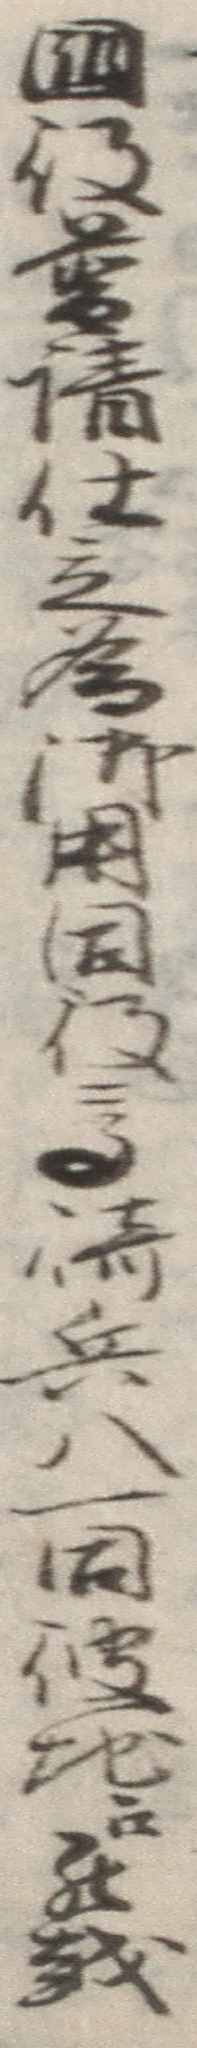国役普請仕立為御用国役高崎兵ハ一同彼地え罷越
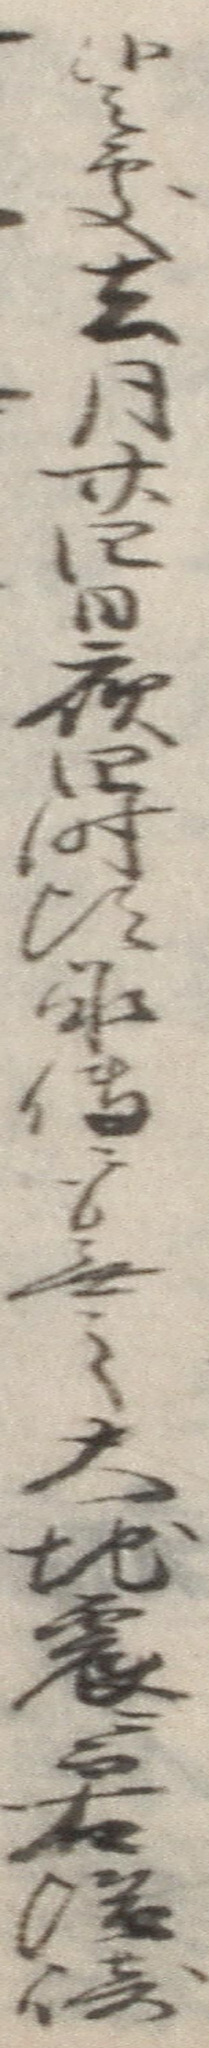候之処去月廿四日夜四時頃承伝ニも無之大地震ニ而右塩崎
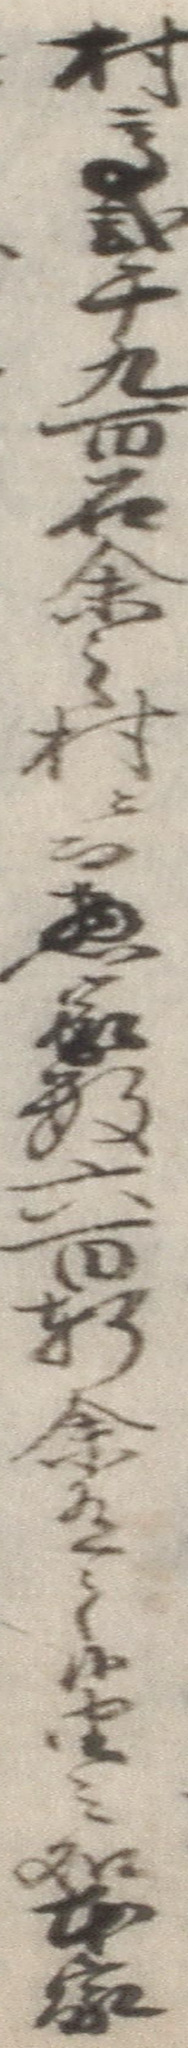村高弐千九百石余之村ニ而惣家数六百軒余有之候由之処本家
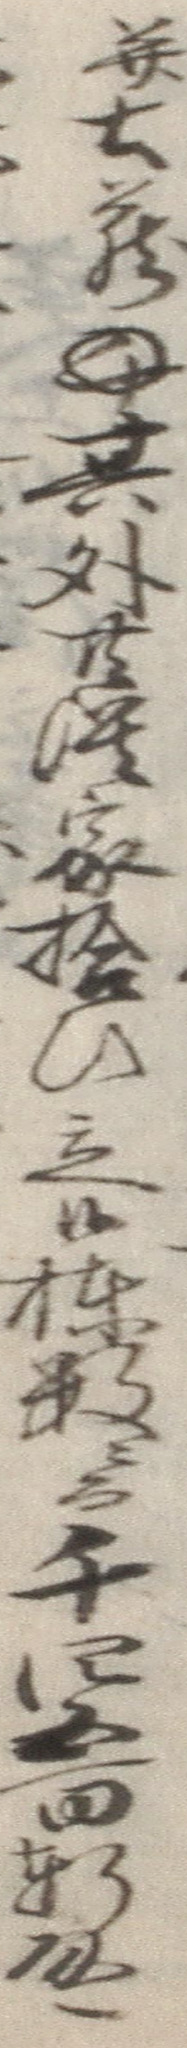并土蔵其外共潰家拾ひ立候棟数ニ而千四五百軒通
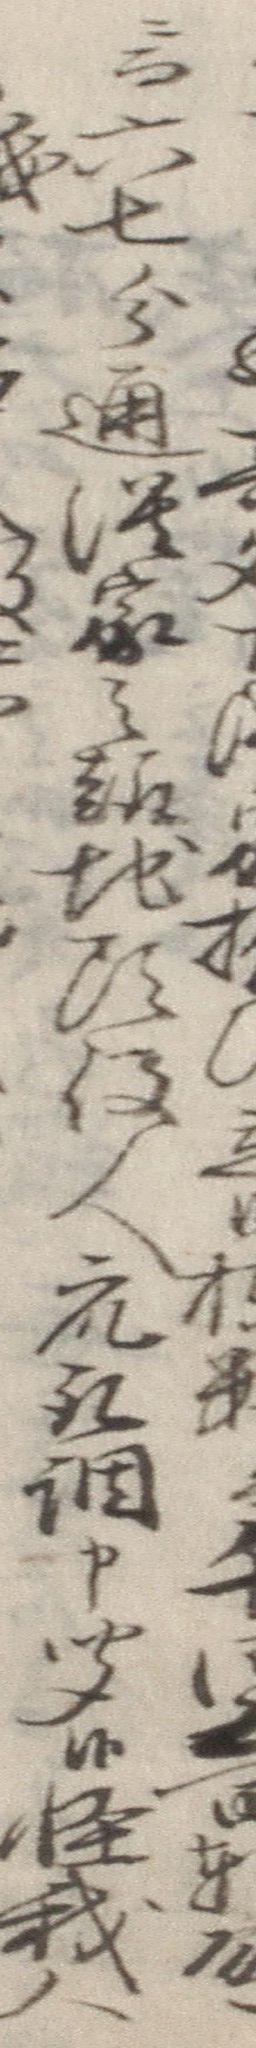ニ而六七分通潰家之趣地頭役人衆取調申聞候怪我人
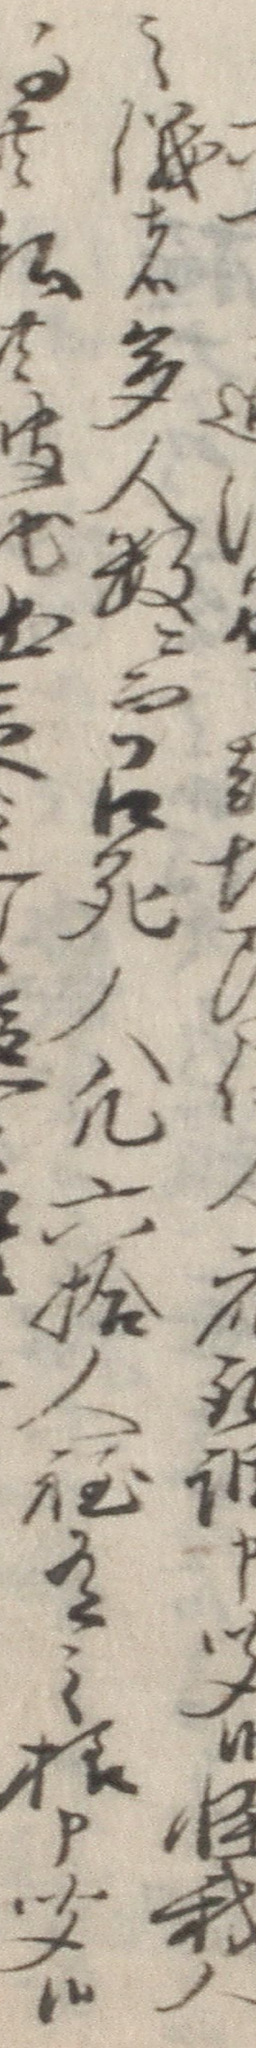之儀は多人数ニ而即死人凡六拾人程有之様申聞候
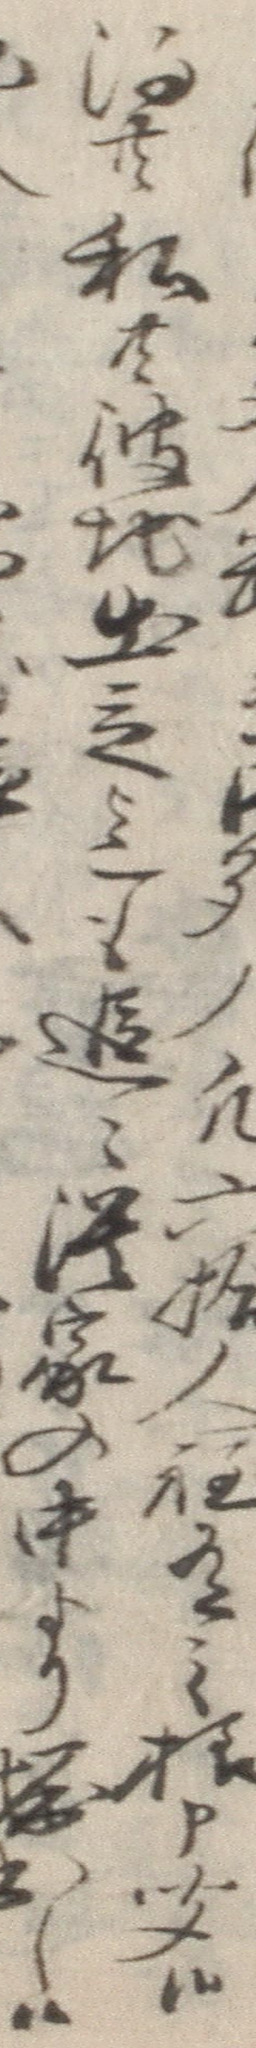得共私共彼地出立迄も追々潰家の中より掘出候
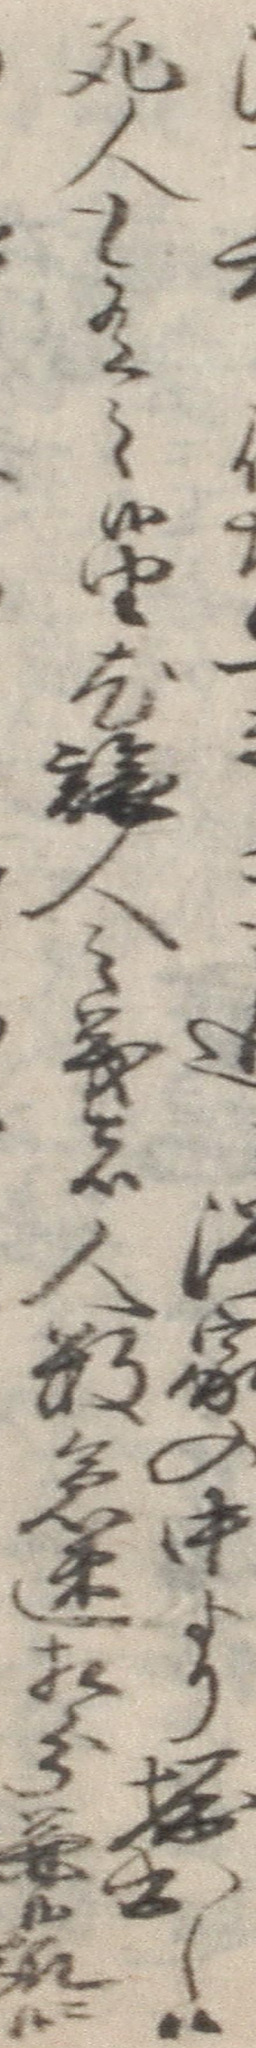死人も有之候由尤旅人之義は人数急速相分兼候趣ニ候
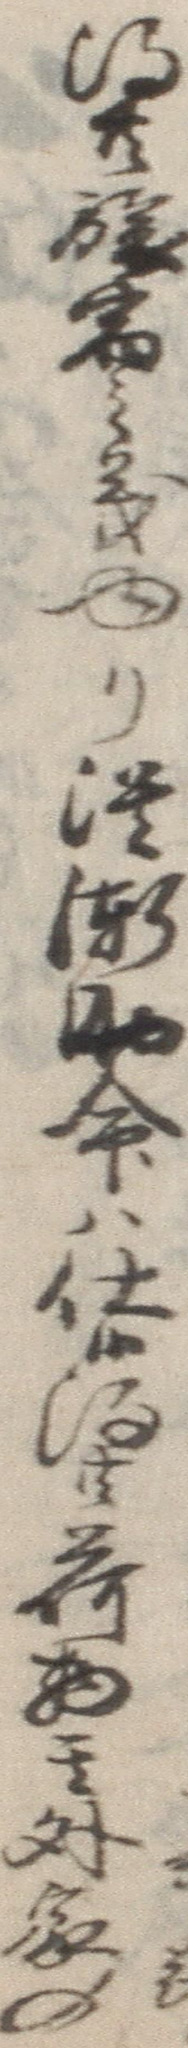得共旅宿之義ゆり潰漸助命ハ仕候得共荷物其外家の
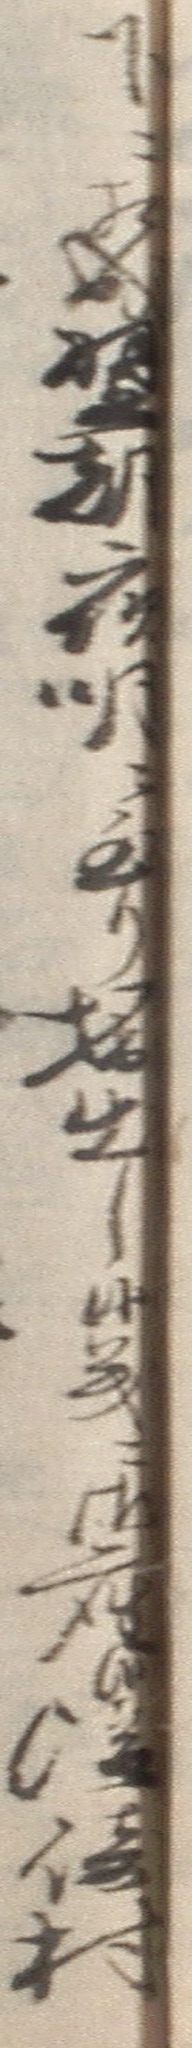下二相成翌朝夜明け至り掘出候義ニ御座候塩崎村
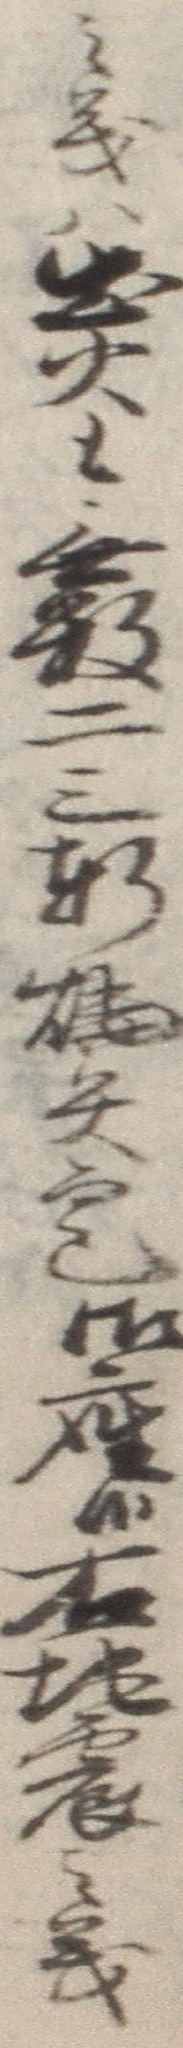之義ハ出火も無数二三軒焼失而已御座候右地震之義
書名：[善光寺地震に関する冊子]
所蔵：東京大学地震研究所図書室 Earthquake Research Institute Library, The University of Tokyo, JAPAN
